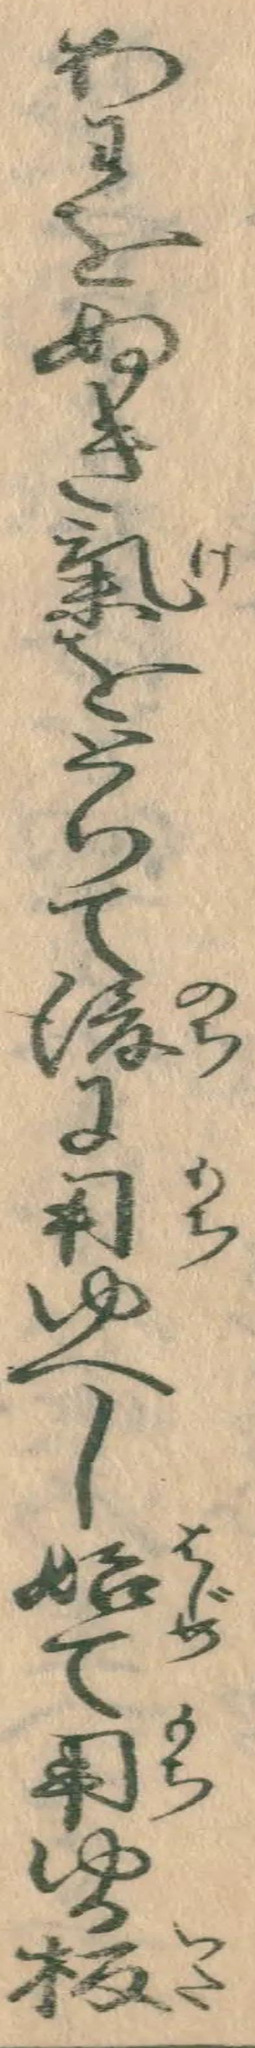あわをぬき気をとりて後に用ゆへし始て用ゆる板
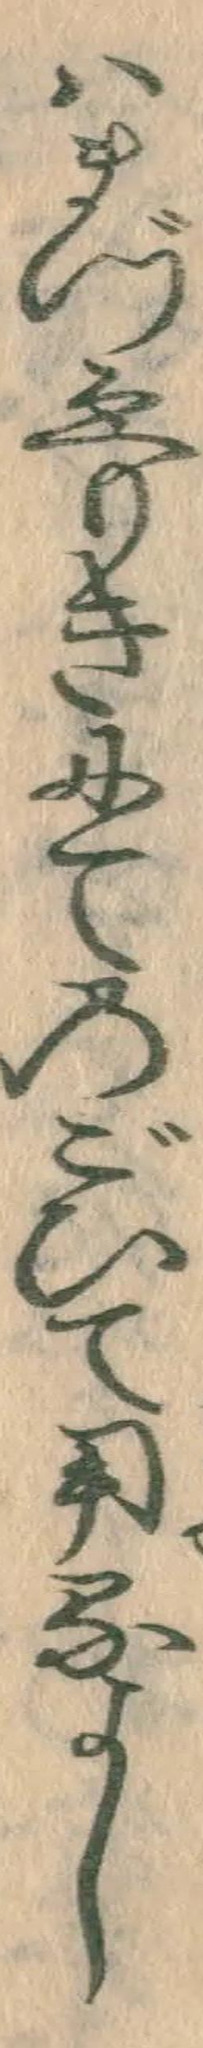はまづゑもきにてのごひて用るよし
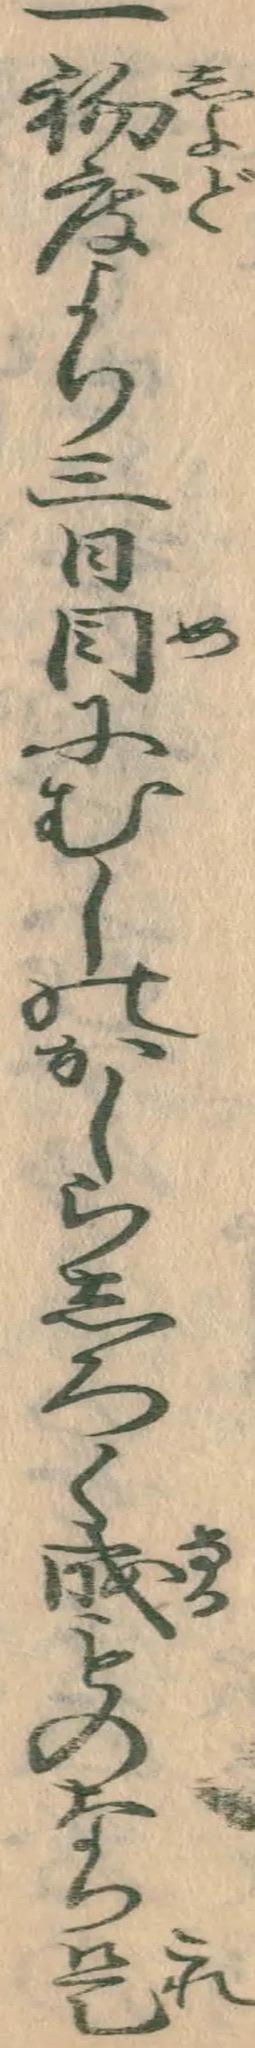一初度より三日目にむしのかしらしろく成ものなり是
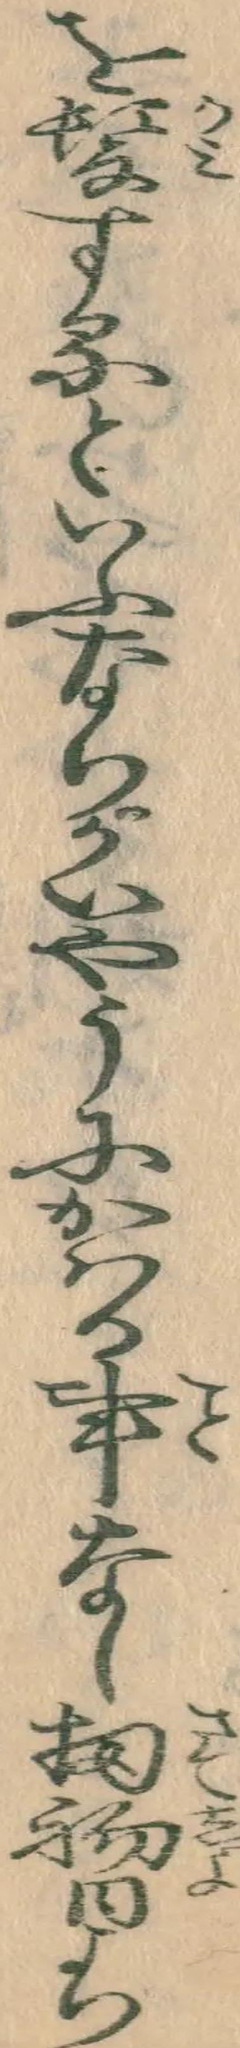を髪するといふなり。かいやうにかはる事なし扨初日より
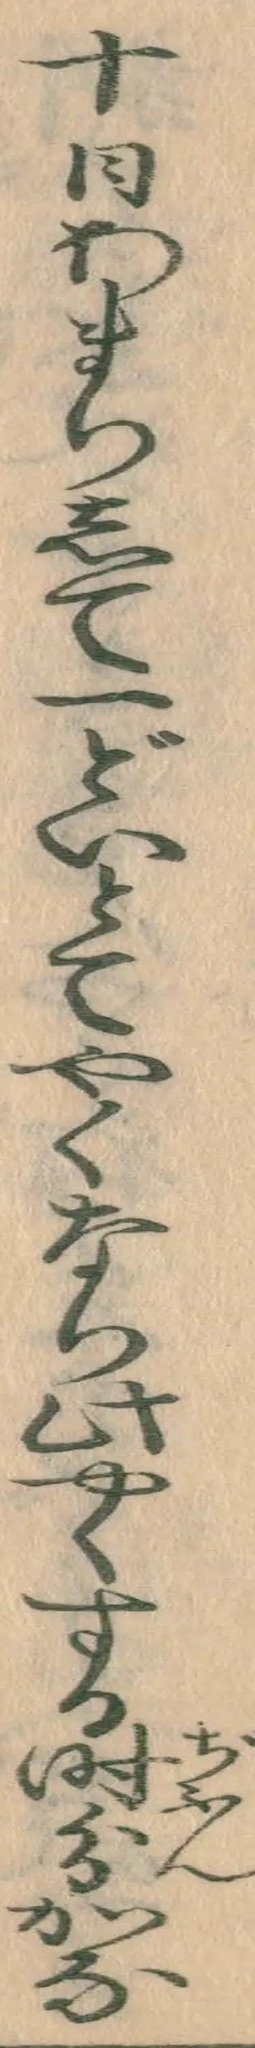十日あまりして一どいとてやくなり此やくする時分かな
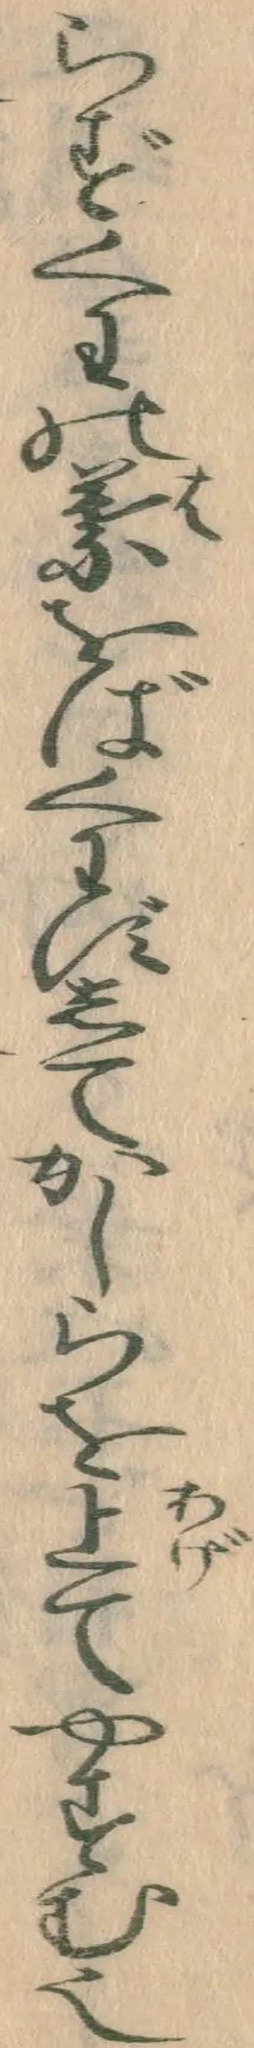らずくわの葉をばくわずしてかしらを上てやすむ也
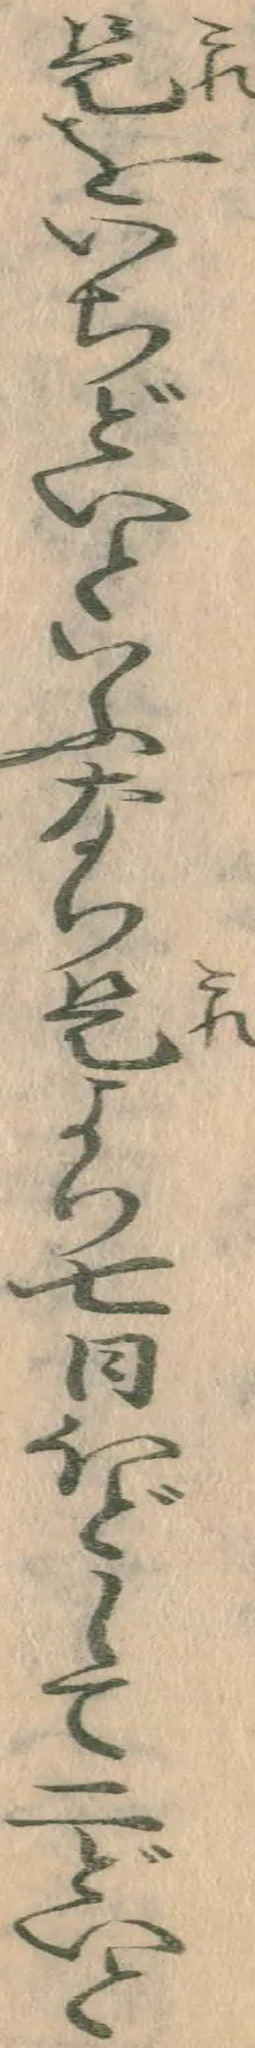是をいちどいといふなり是より七日ほどして二どいと
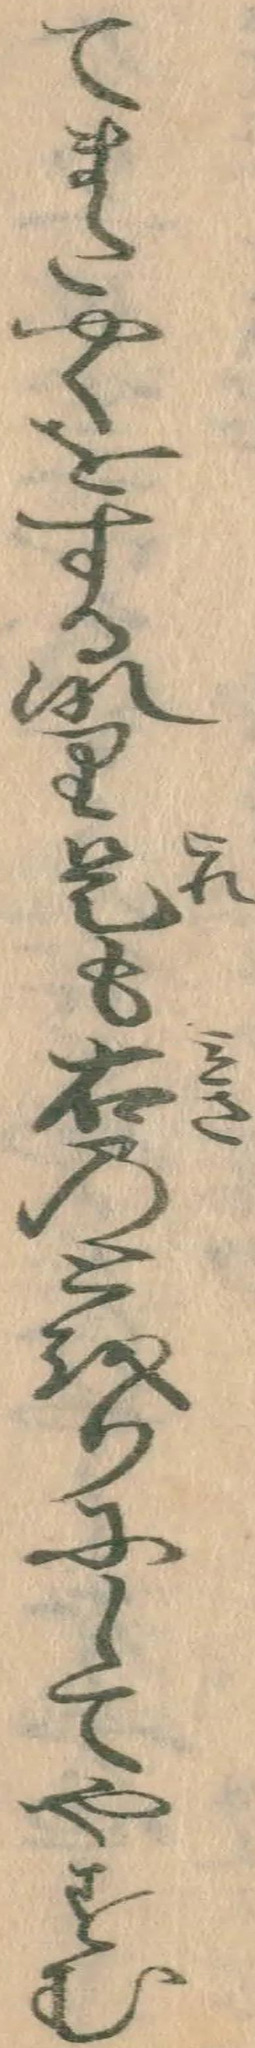てまたやくをするなり是も右のとをりにしてやすむ
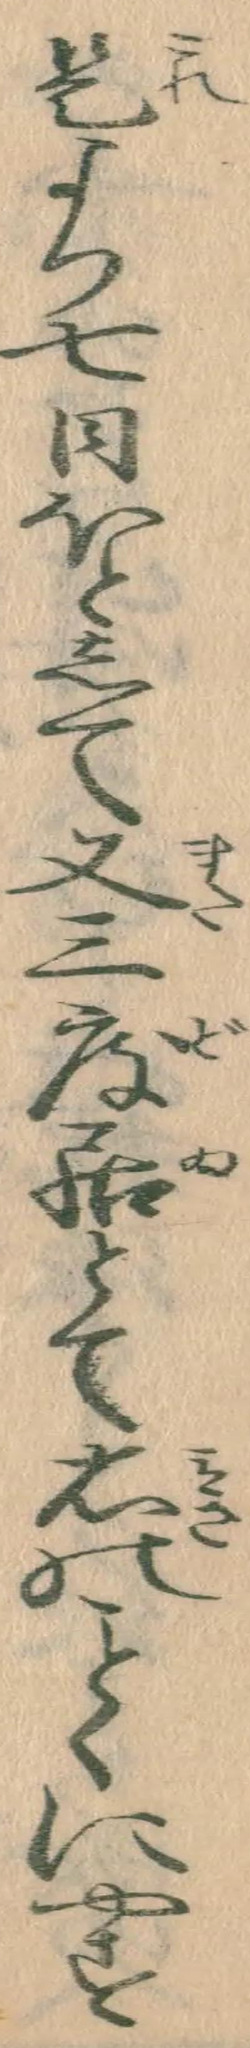是より七日ほとして又三度居とて右のことくにやす
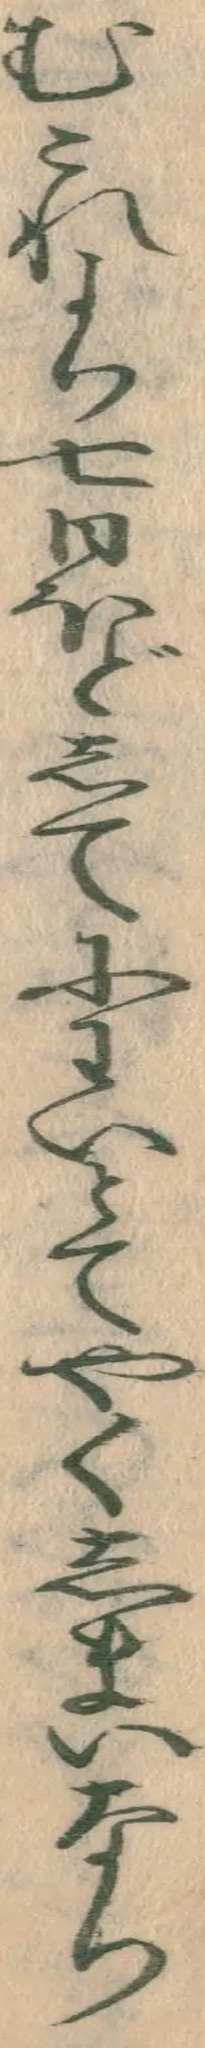むこれより七日ほどしてにわいとてやくしまいなり
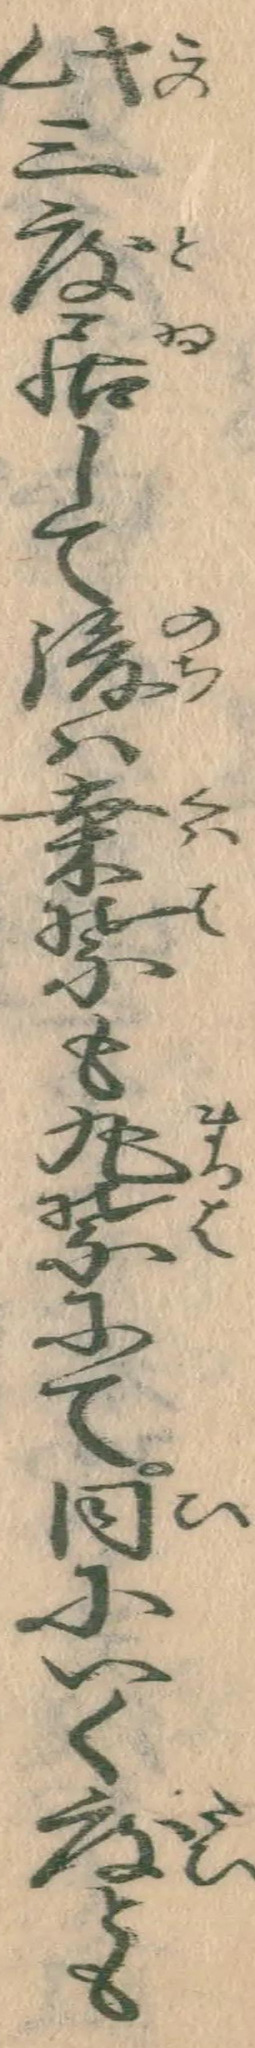此三度居して後は桑葉も丸葉にて。日にいく度とも
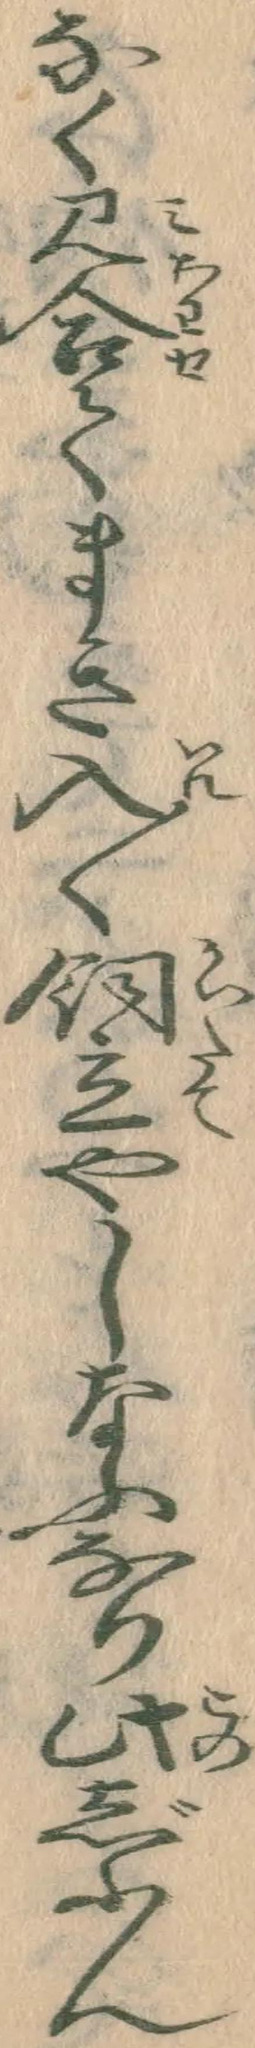なく見合てまき入〳〵飼立やしなふなり此じふん
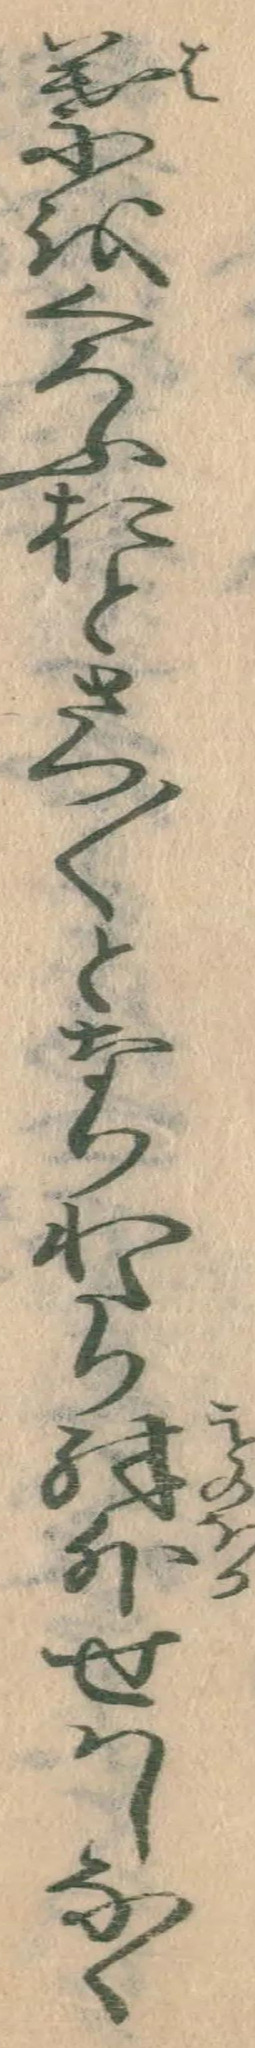葉をくろふおとさつ〳〵となりわたり殊外せはしなく
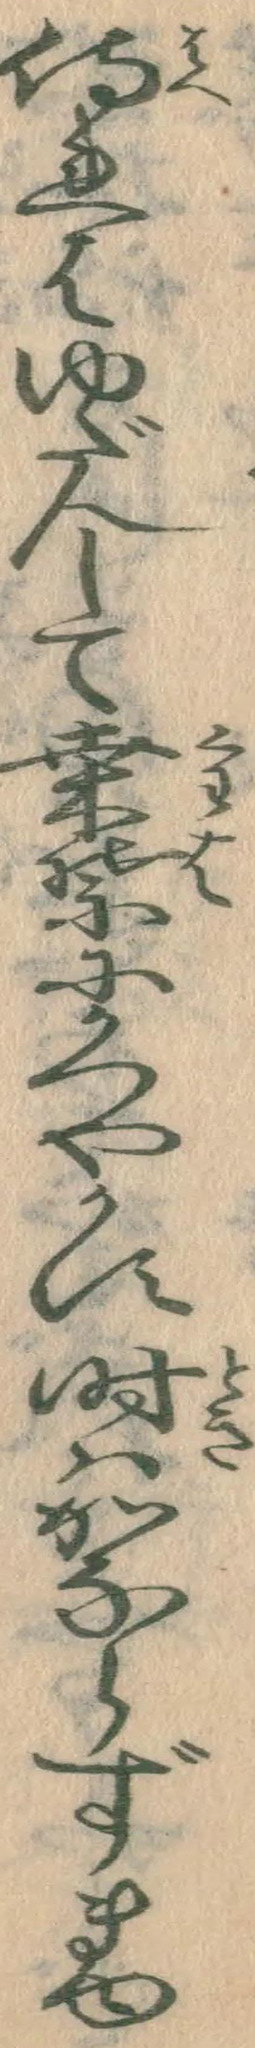侍れはゆだんして桑葉にかつやかす時はかならずまゆ
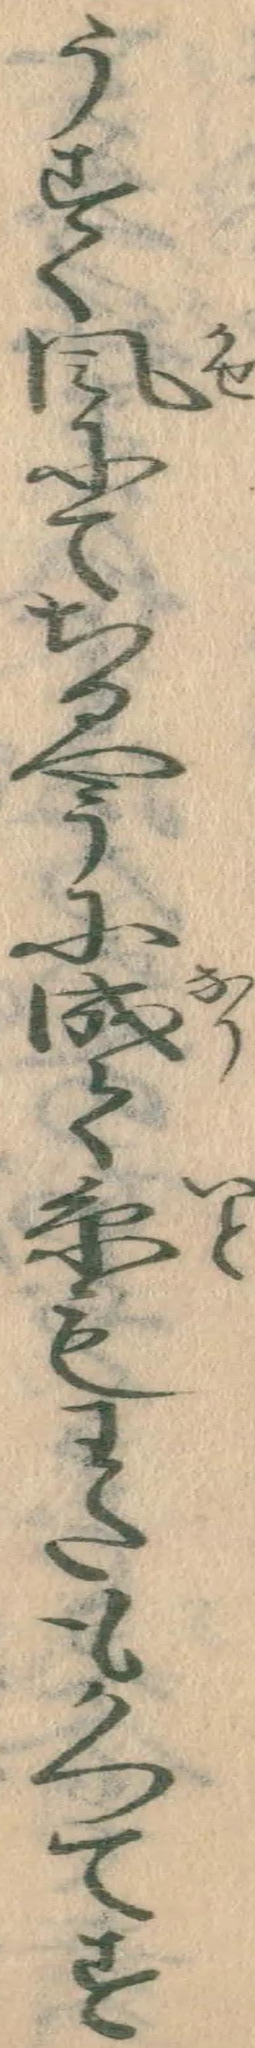うすく風にてちるやうに成て糸もわたもかつてす
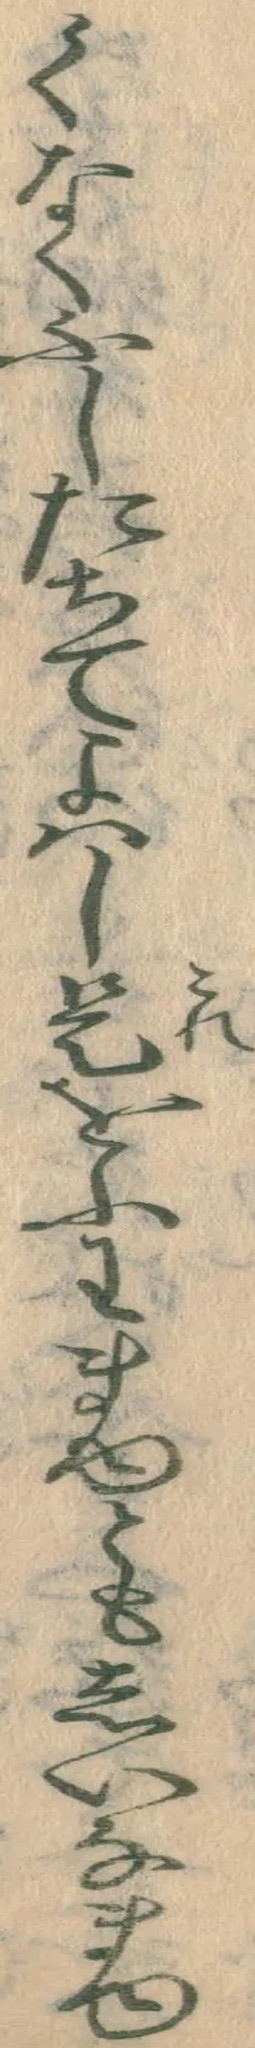くなくふしたちてよはし是をふわまゆともしいなまゆ
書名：蚕飼養法記
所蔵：国立国会図書館 National Diet Library, JAPAN
